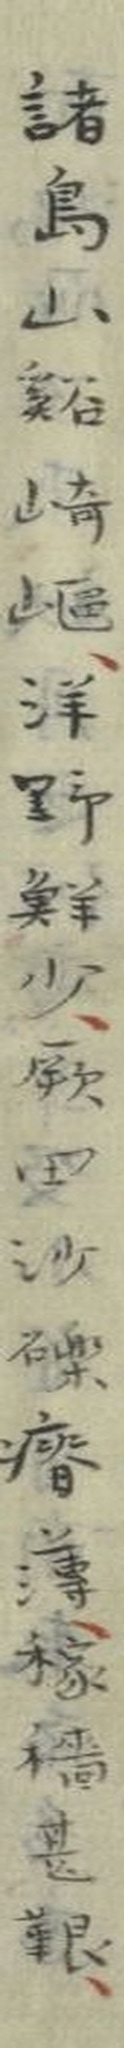諸島山谿崎嶇、洋野鮮少、厥田沙礫瘠薄、稼穡甚艱、
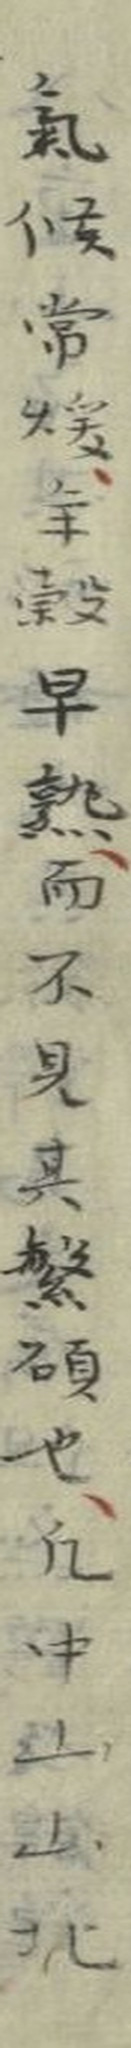気候常煖、年穀早熟、而不見其繁碩也、凡中山山北
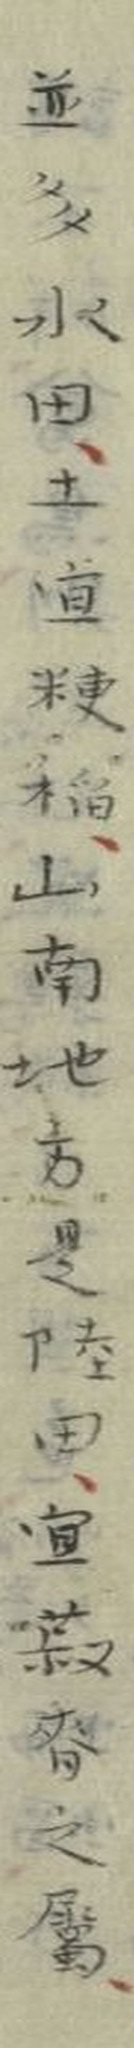並多水田、土宜粳稲、山南地方是陸田、宜菽之属、
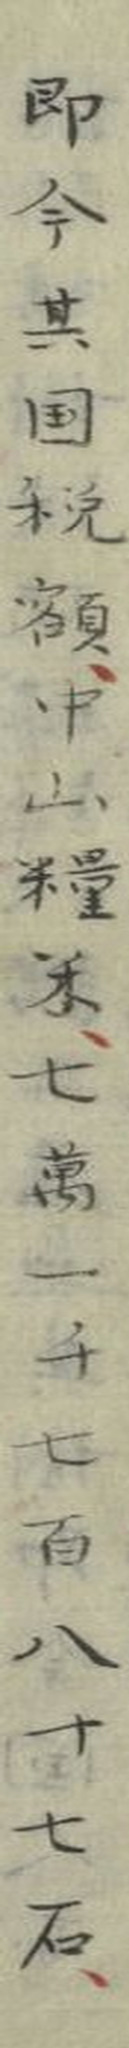即今其国税額、中山糧米、七万一千七百八十七石、
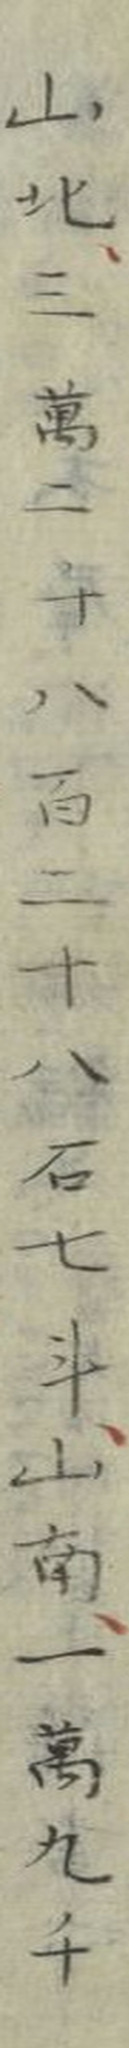山北、三万二千八百二十八石七斗、山南、一万九千
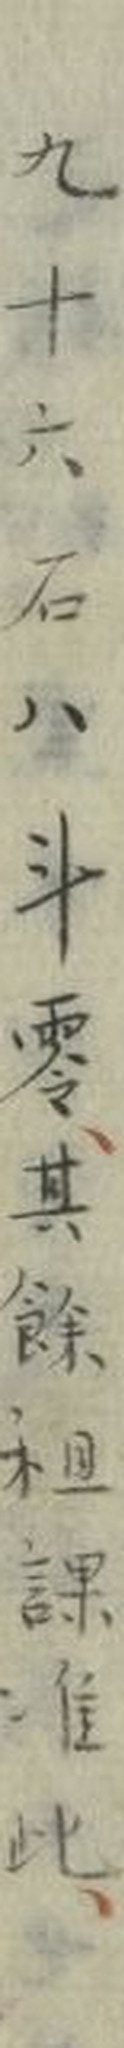九十六石八斗零、其余租課准此、
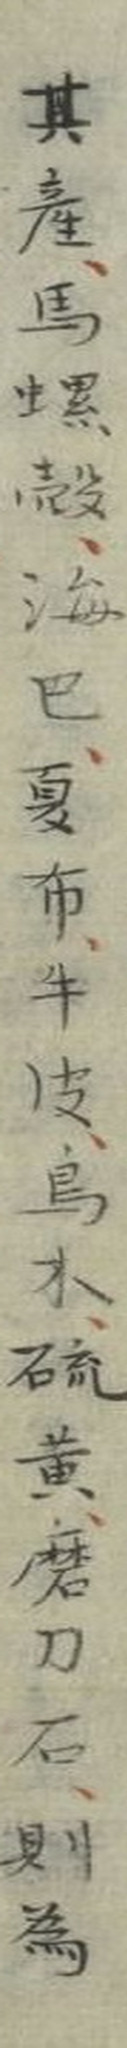其産、馬螺殻、海巴、夏布、牛皮、鳥木、硫黄、磨刀石、則為
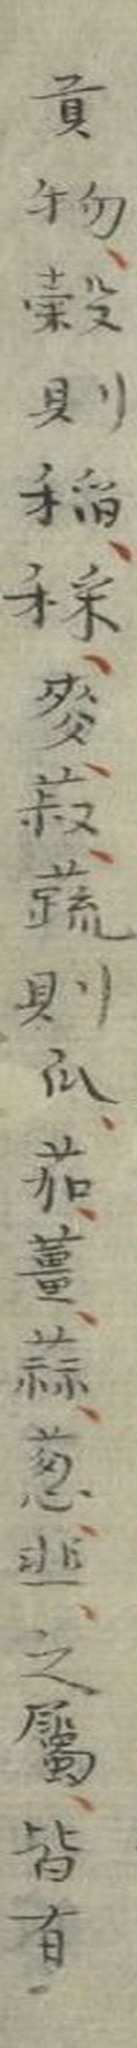貢物、殻則稲、、麦、菽、蔬則瓜、茄、薑、蒜、葱、韭、之属、皆有
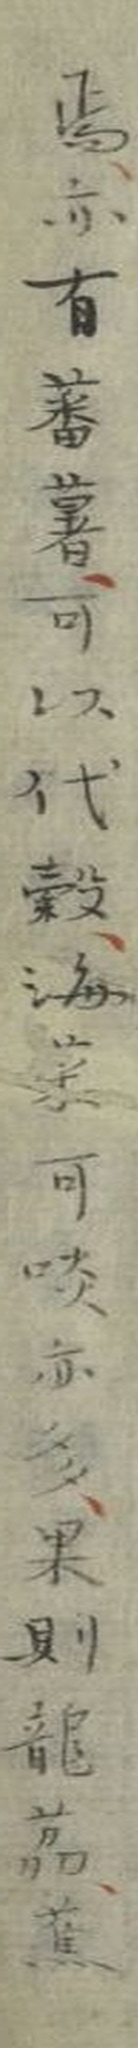焉、又有蕃薯、可以代穀、海菜可啖亦多、果則龍茘、蕉

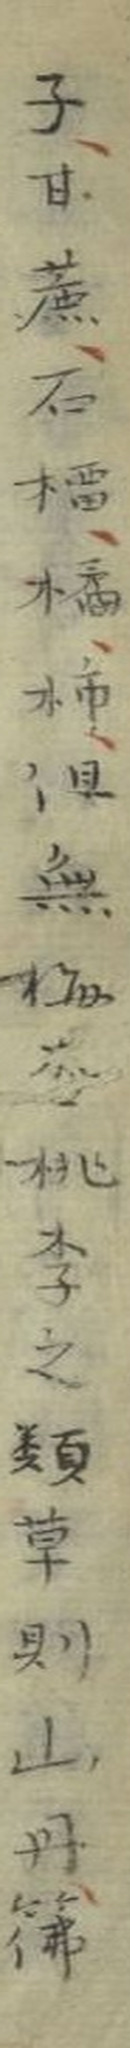子、甘蔗、石橊、橘、柿、但無梅桃李之類草則山丹、
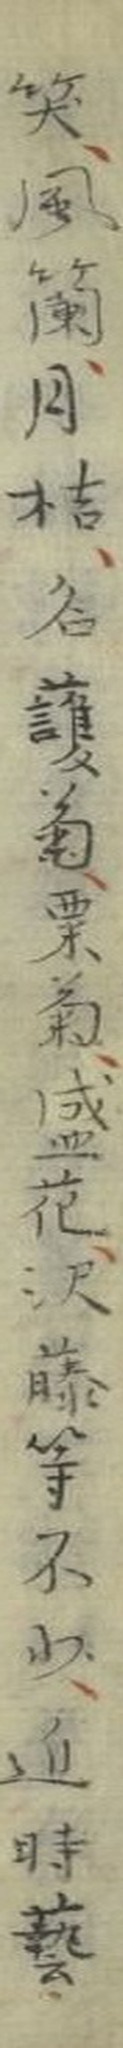笑、風蘭、月桔、名護菊、粟菊、盛花、沢藤等不少、近時芸
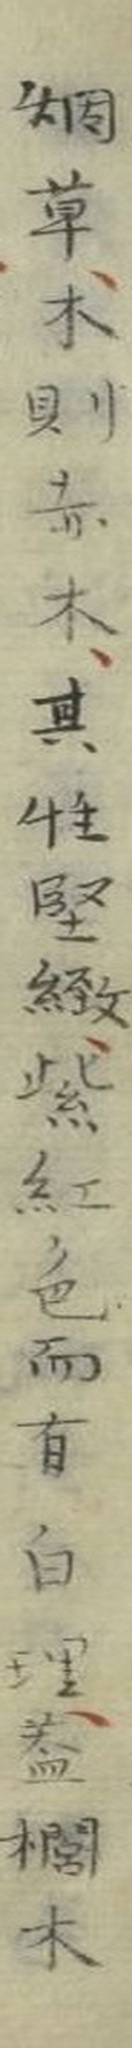烟草、木則赤木、其性堅緻、紫紅色而有白理、蓋櫚木
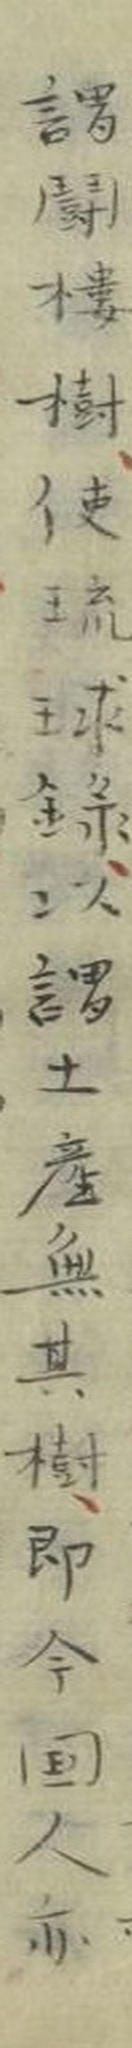謂闘樓樹、使琉球録、以謂土産無其樹、即今国人亦
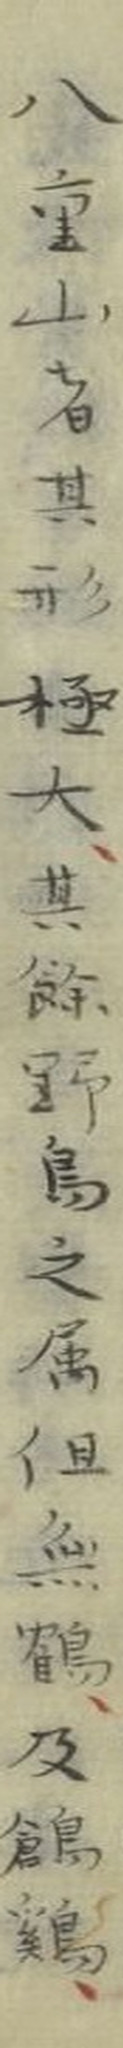八重山者其形極大、其余野鳥之属但無鶴、鶬鶏、
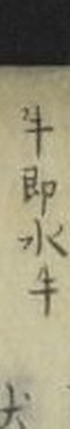牛即水牛
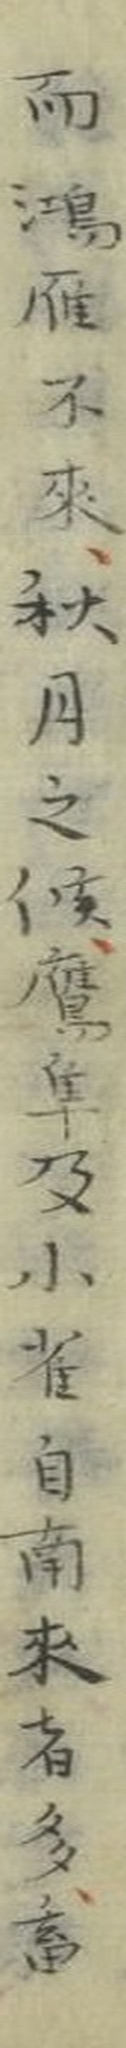而鴻雁不来、秋月之候、鷹、隼及小雀自南来者多、畜
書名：琉球
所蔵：University of the Ryukyus Library
